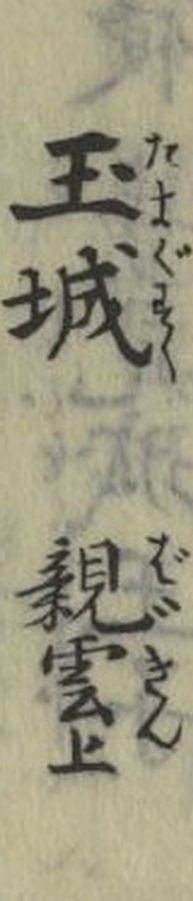玉城親雲上
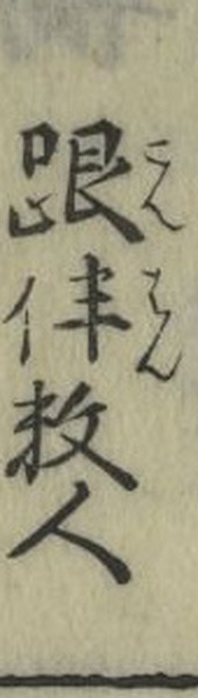跟伴数人
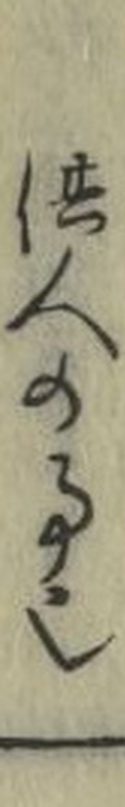供人の事也

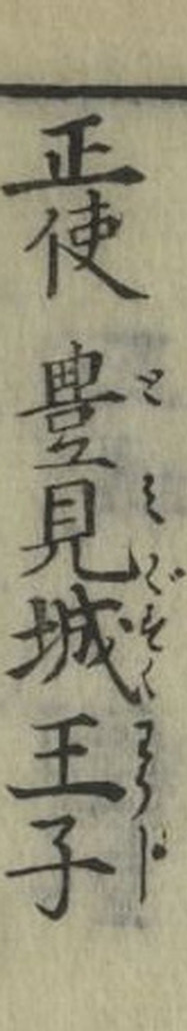正使豊見城王子
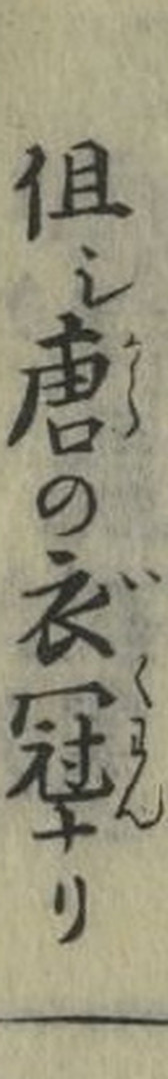但唐の衣冠ナリ
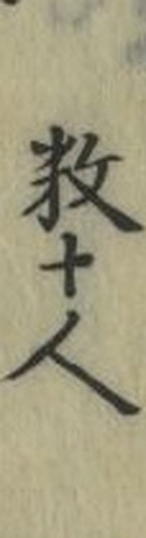数十人
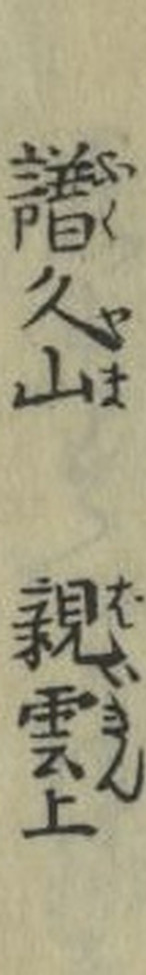譜久山親雲上
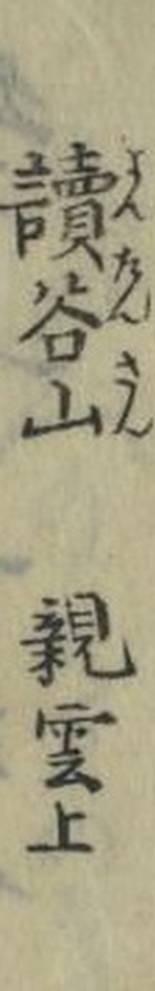讀谷山親雲上
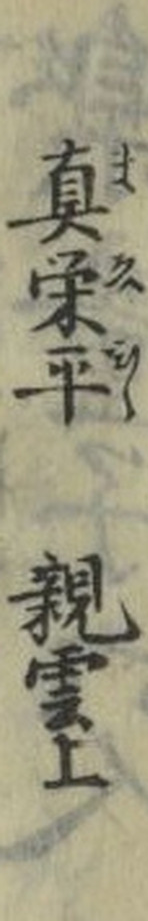真栄平親雲上
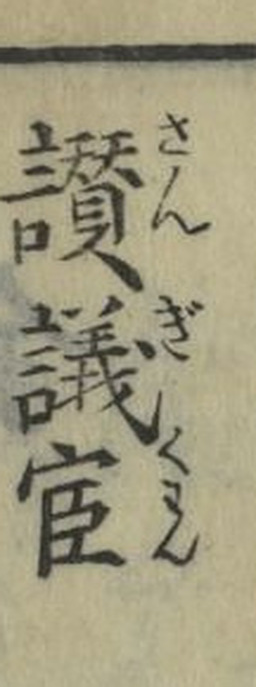讃議宦
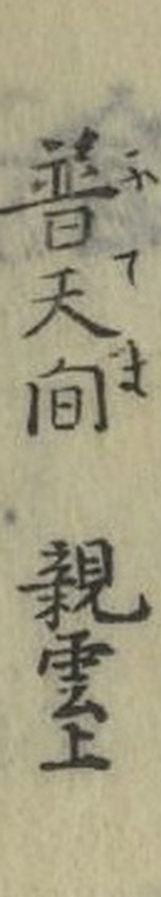普天間親雲上
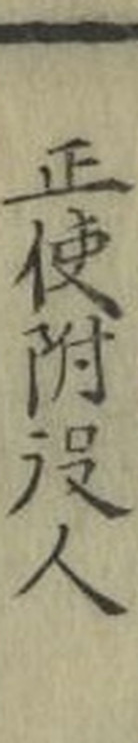正使附従人
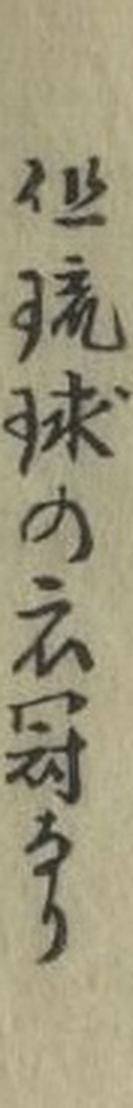但琉球の衣冠なり

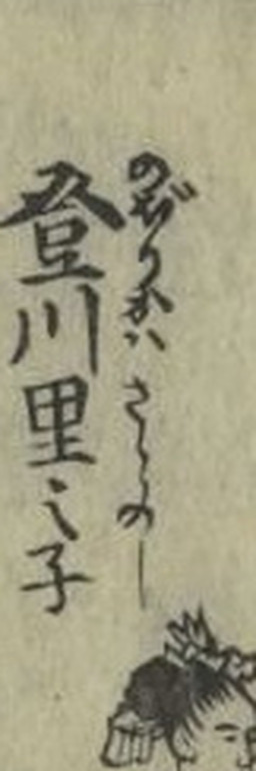登川里之子
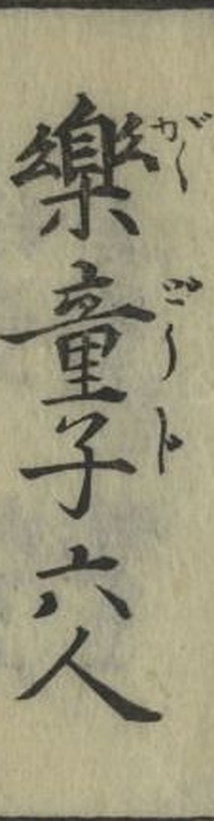樂童子六人
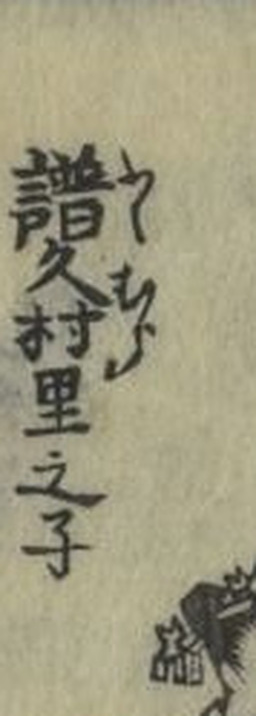譜久村里之子
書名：[琉球人行列記]
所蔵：University of the Ryukyus Library
